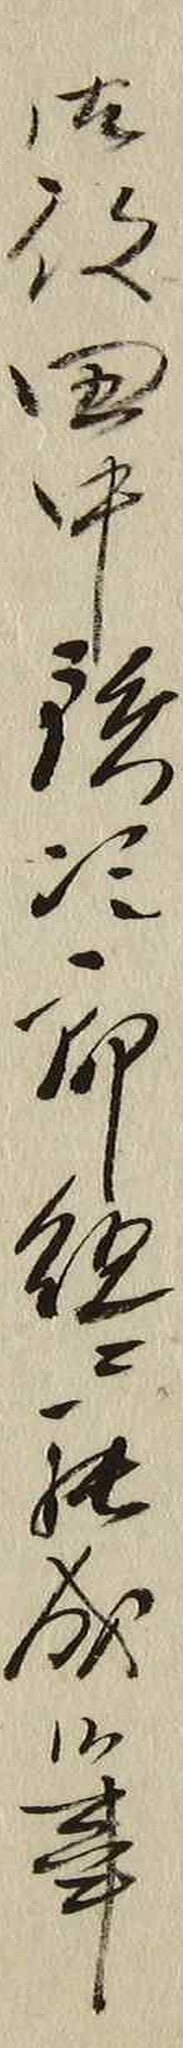御役田中鉄次郎組罷成候事
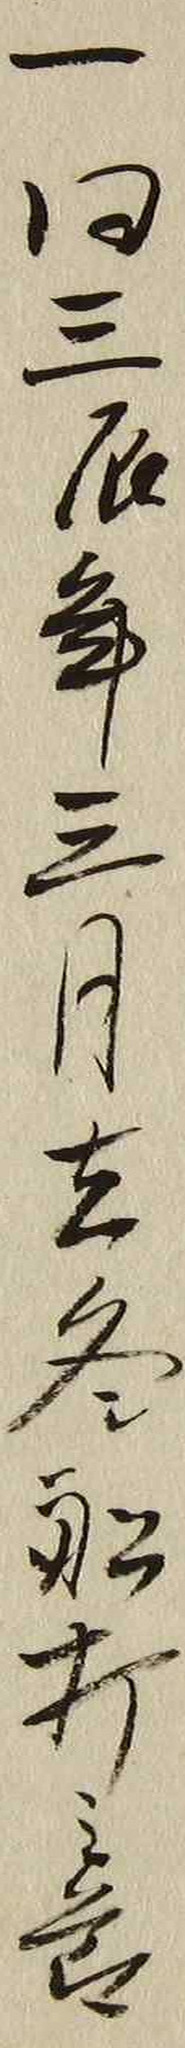一同三辰年三月去冬船打之節
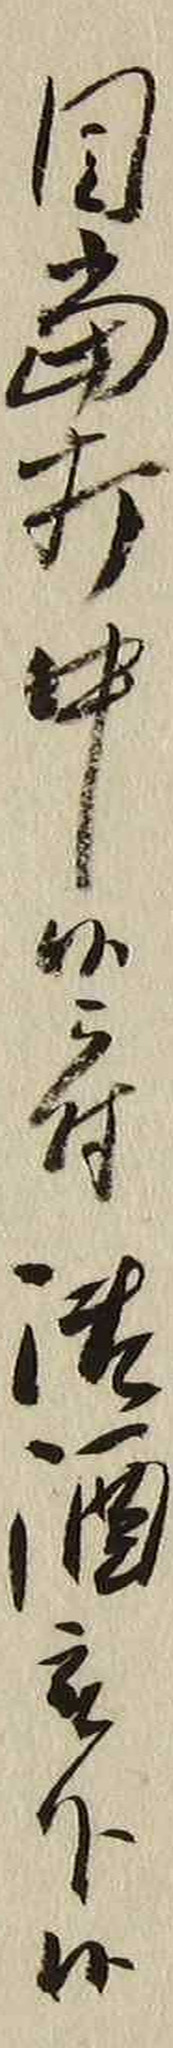目当打中候付御酒被下候
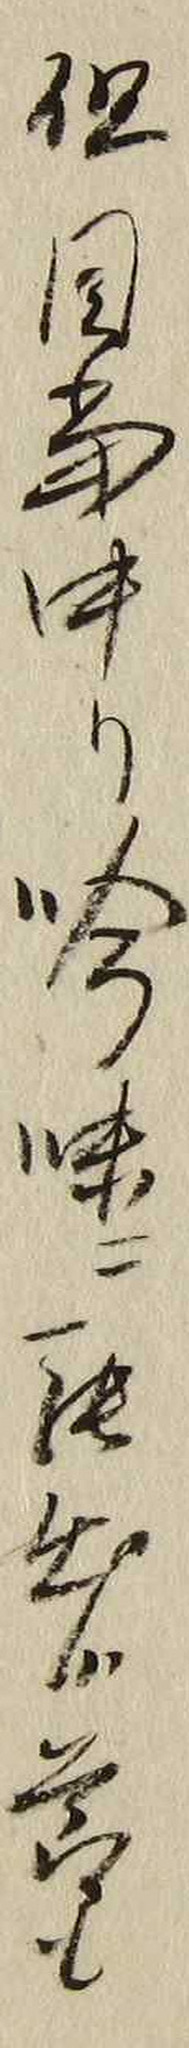但目当中り吟味罷座出候節も
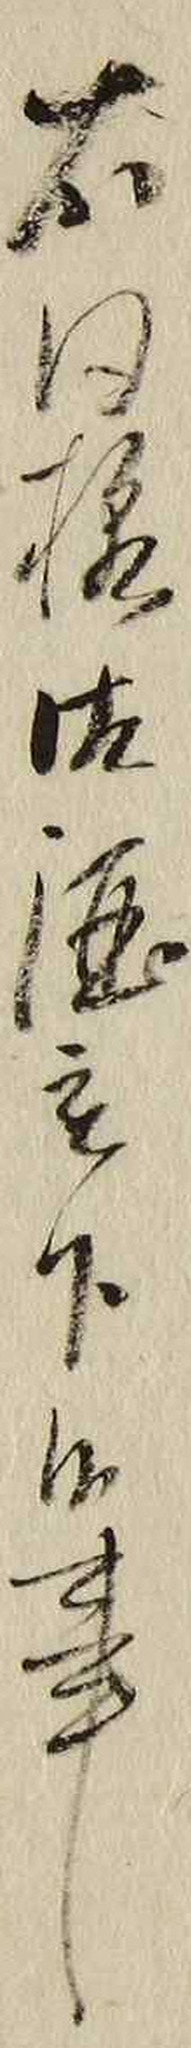右同様御酒被下候事
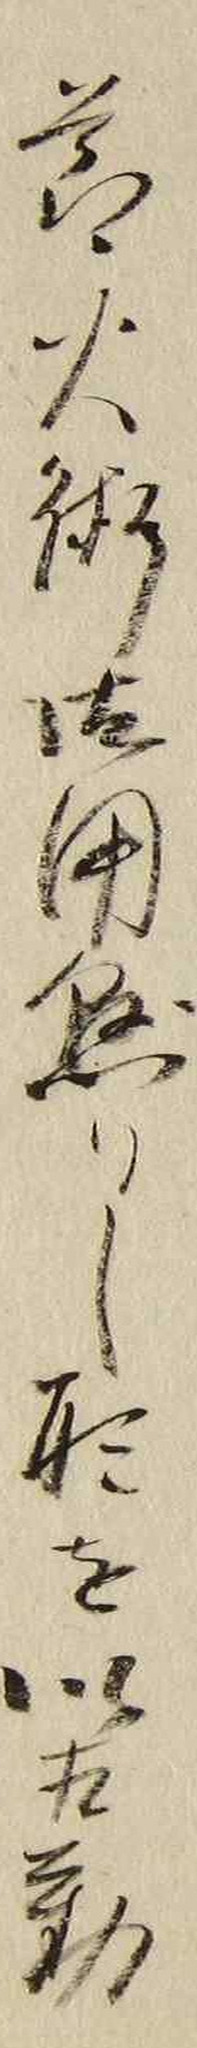節火術御用懸り之形を以相勤

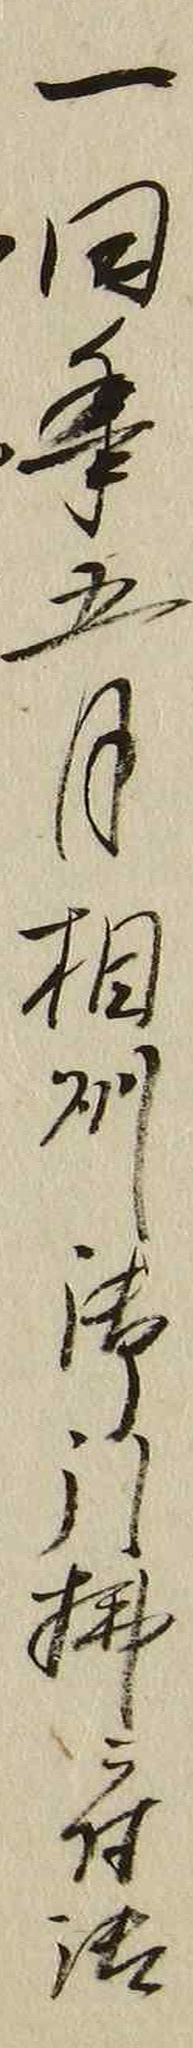一同年五月相州御引払付御
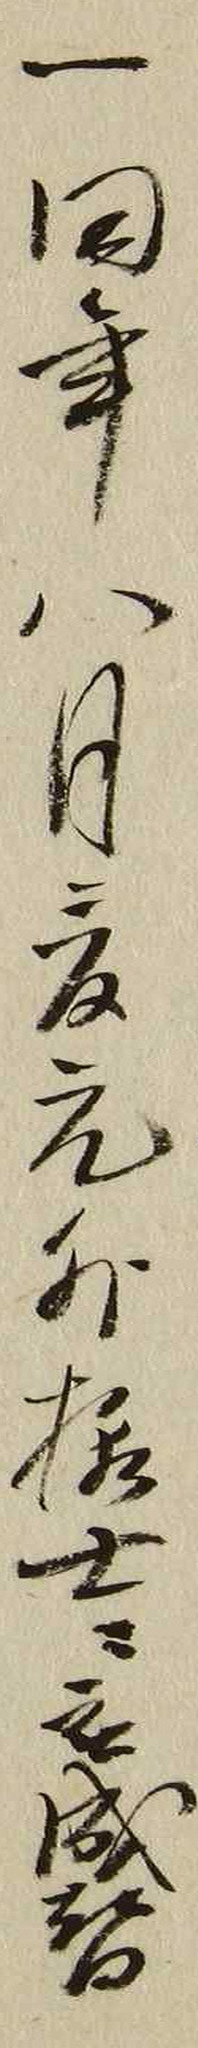一同年八月夏元外様士被成替
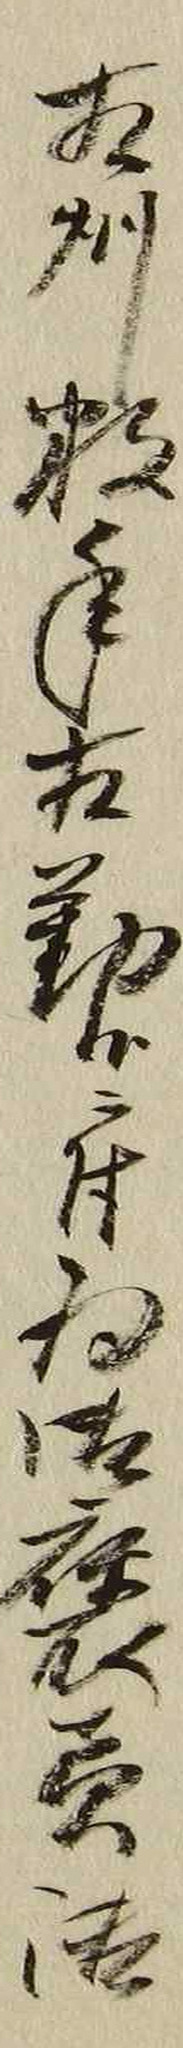相州数年相勤候付為御褒美御
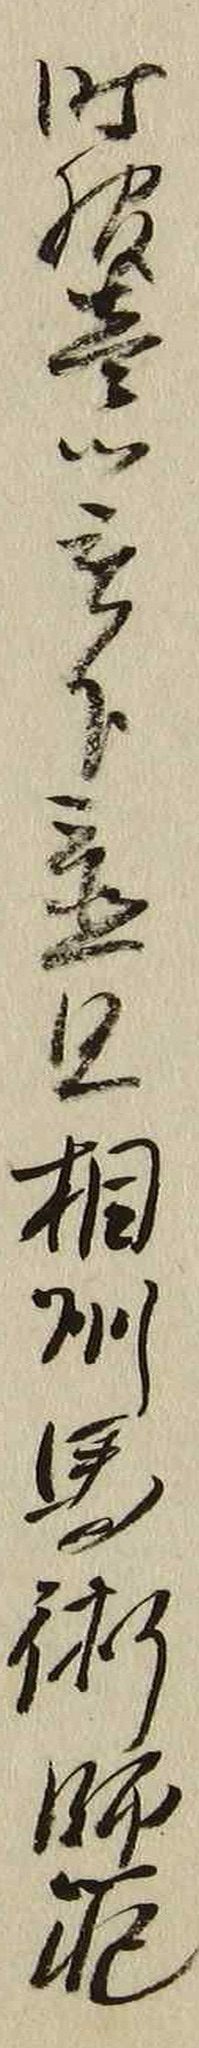時服壱ツ被下置且相州馬術師範
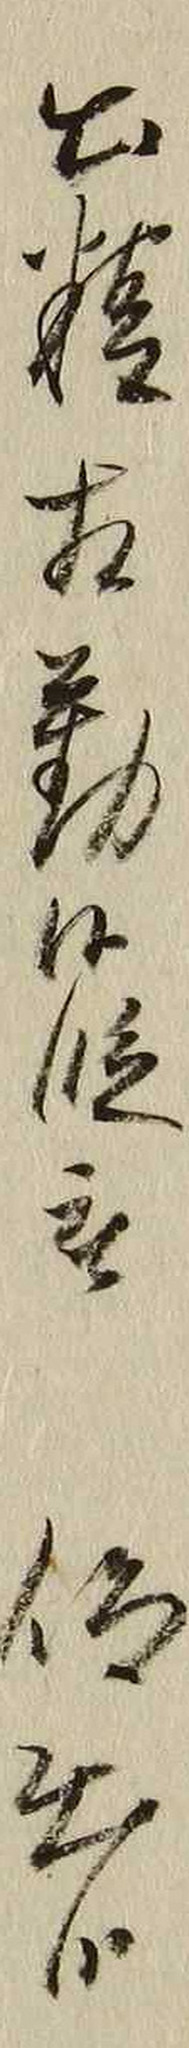出精相勤候段被仰出候
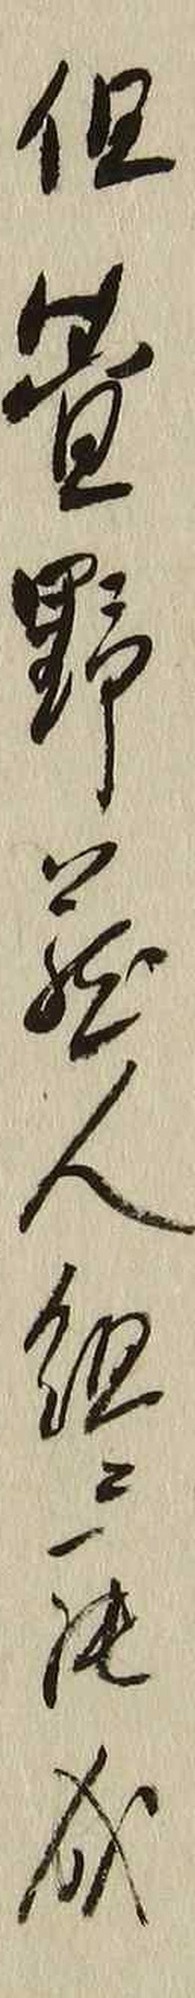但萱野蔵人組罷成
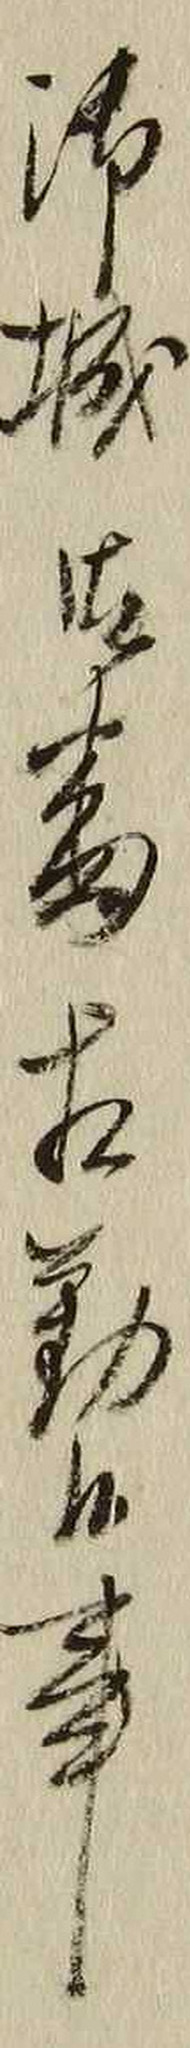御城御番相勤候事
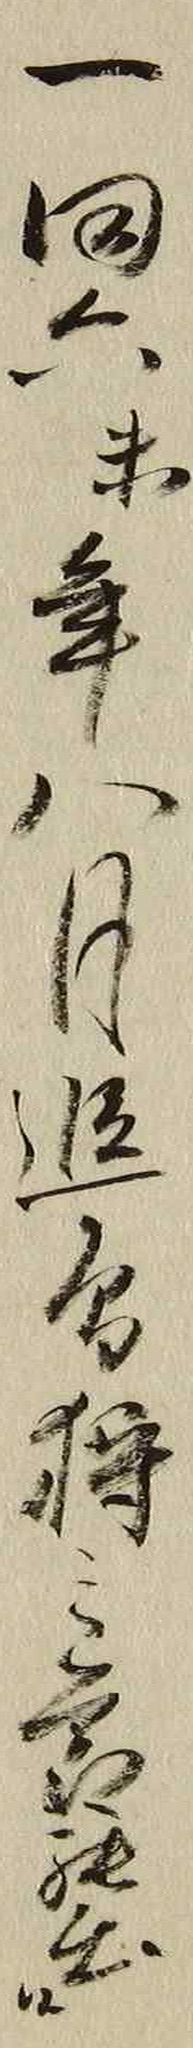一同六未年八月追鳥狩之節罷出候
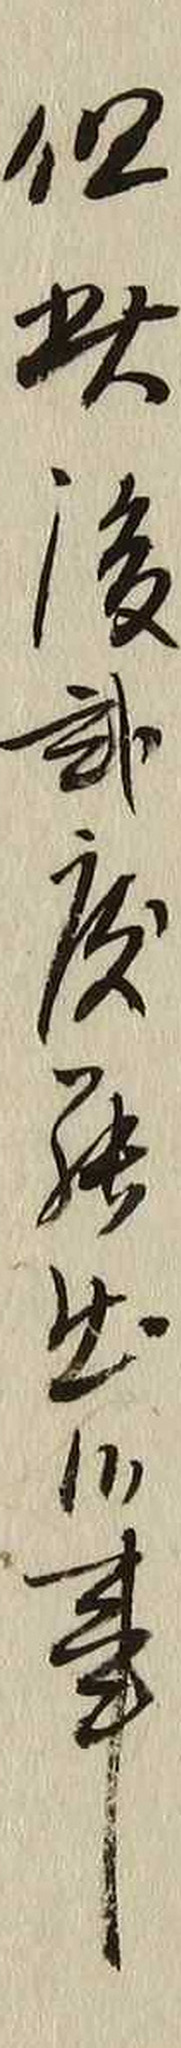但此後弐度罷出候事
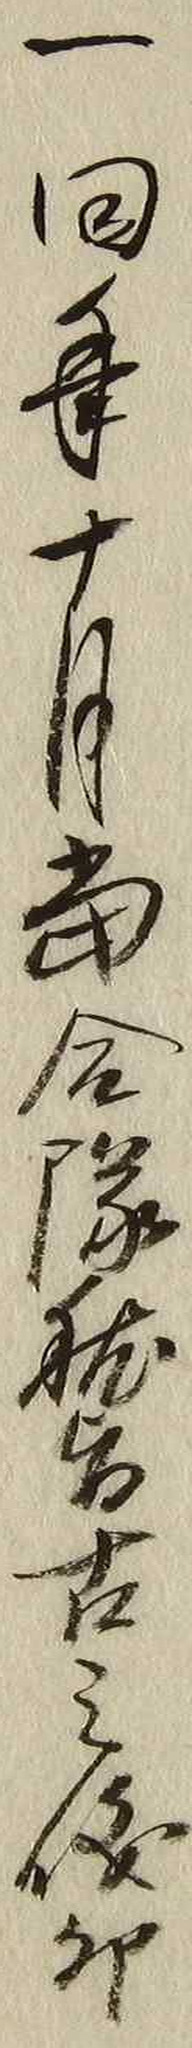一同年十月当合隊稽古之儀卯
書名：諸士系譜　巻之350　せ之部1冊全
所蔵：会津若松市立会津図書館
